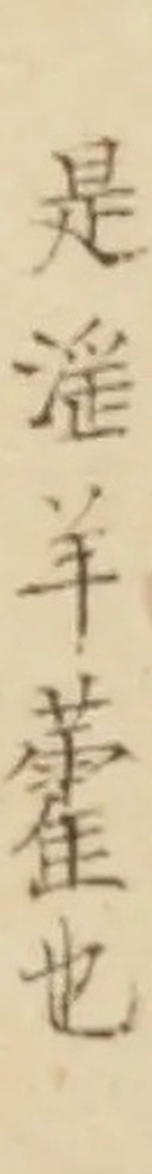是淫羊藿也
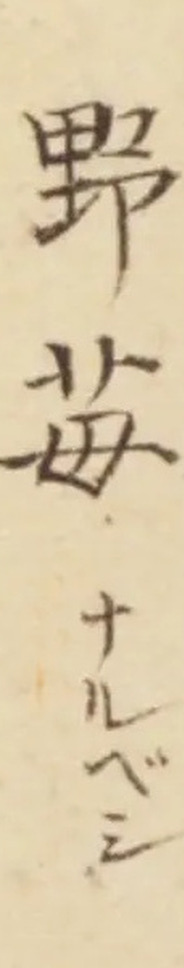野苺ナルベシ
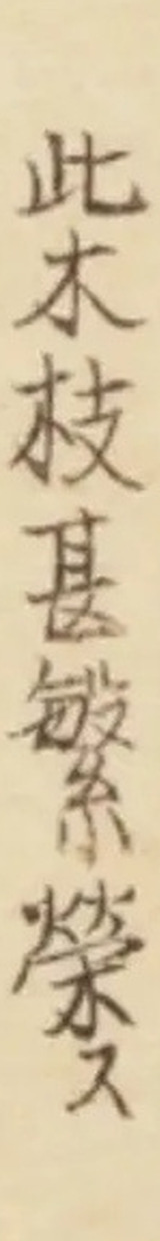此木枝甚繁栄ス
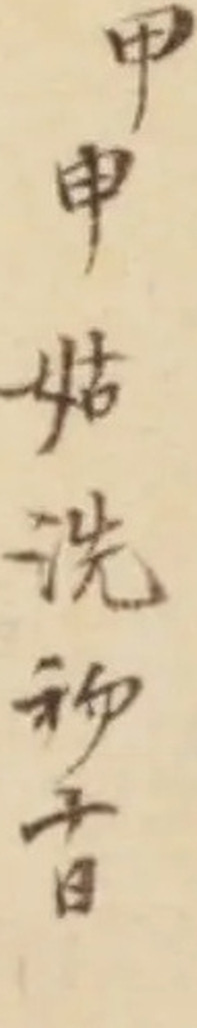甲申姑洗初十日
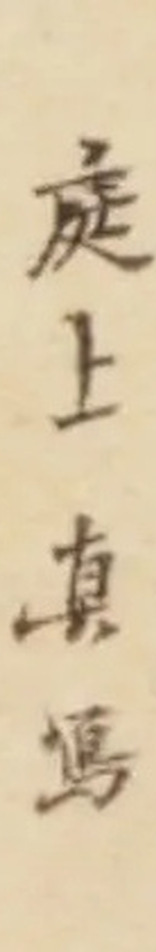庭上真写
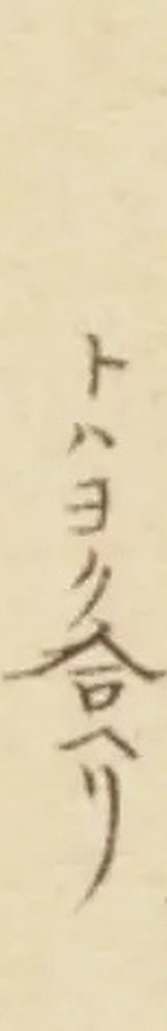トハヨク合ヘリ
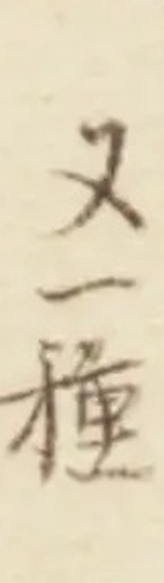又一種
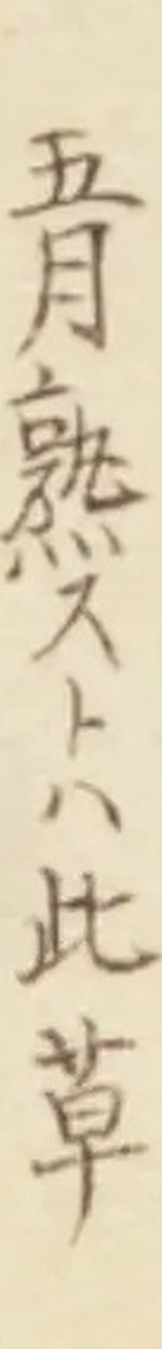五月熟ストハ此草
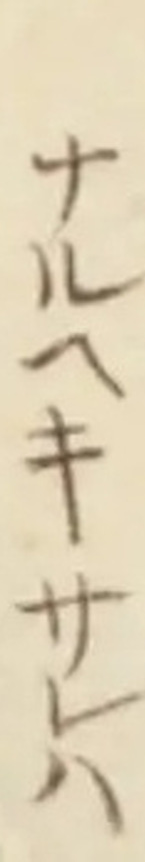ナルヘキサレハ
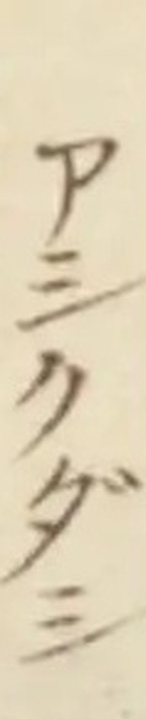アシクダシ
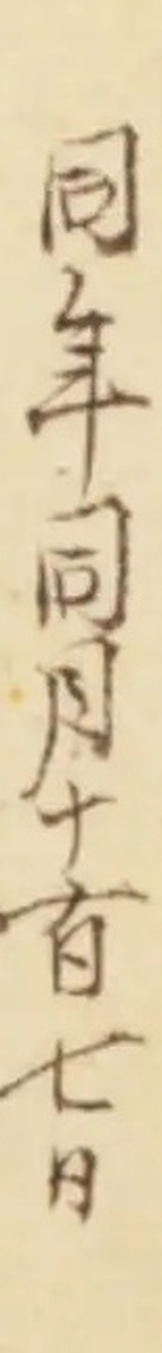同年同月十有七日
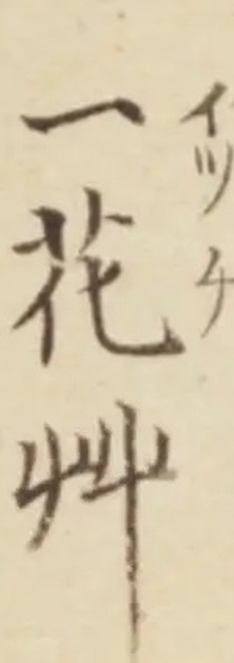一花艸
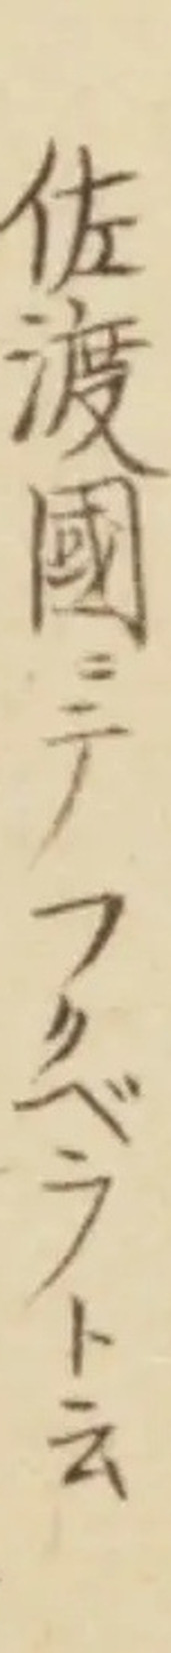佐渡国ニテフクベラト云
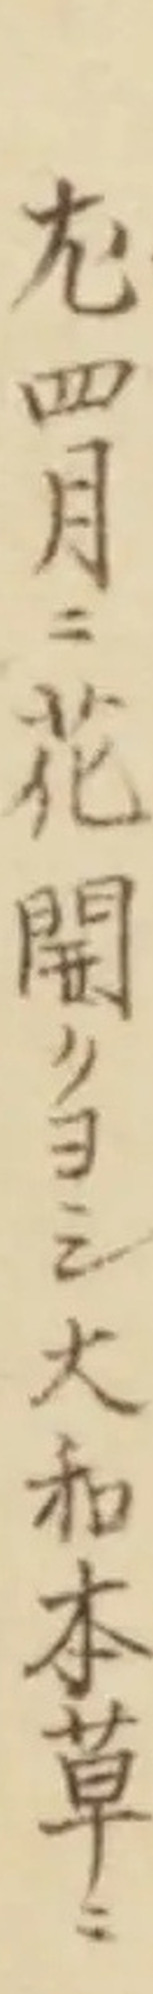尤四月ニ花開クヨシ大和本草ニ
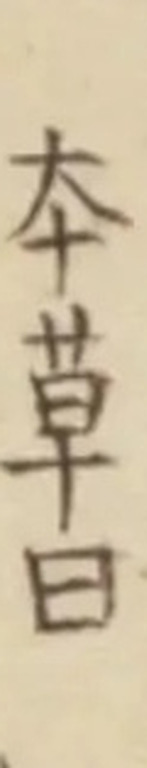本草曰
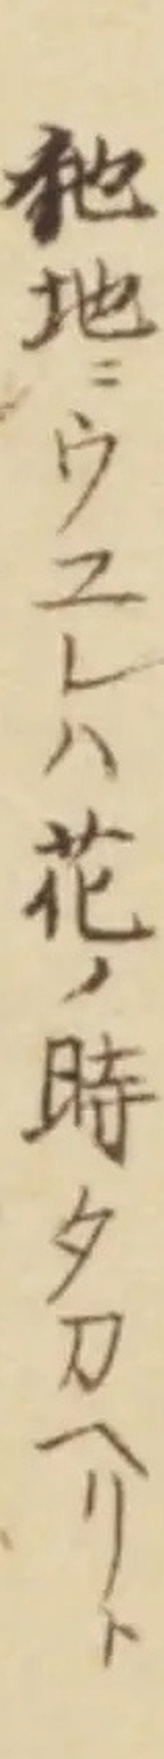他地ニウユレハ花の時タカヘリト
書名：梅園草木花譜春之部. 1
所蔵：国立国会図書館 National Diet Library, JAPAN
